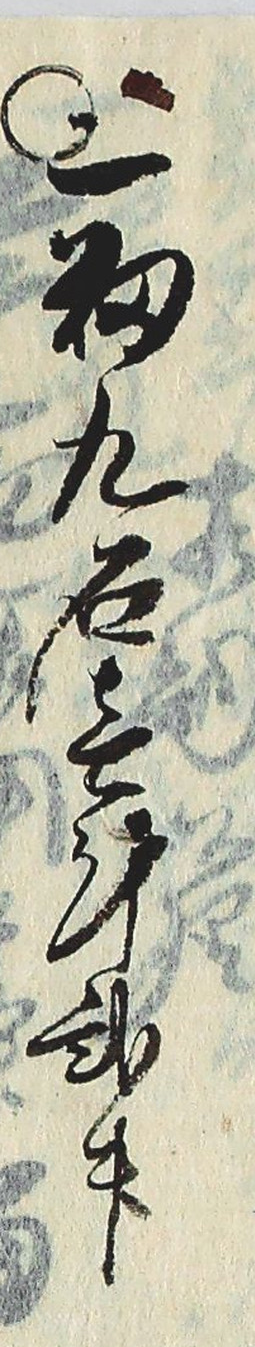一籾九石壱斗弐升
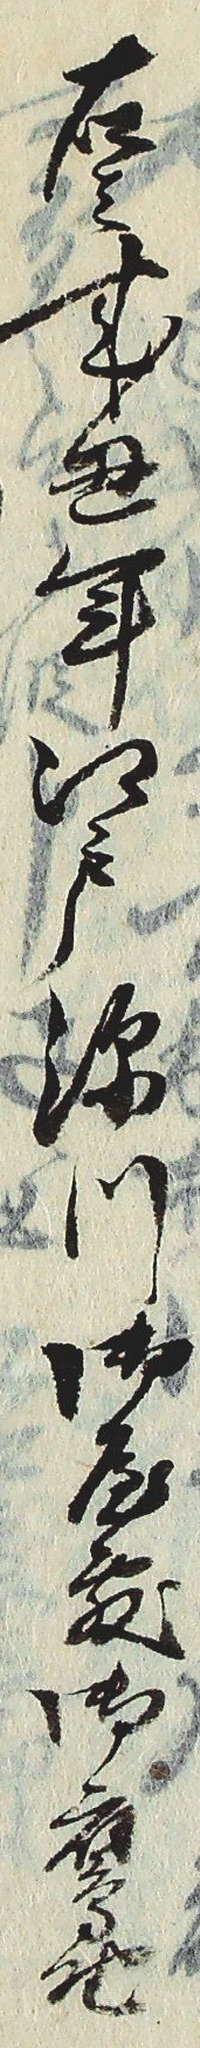右は来丑年江戸深川御屋敷御鷹野
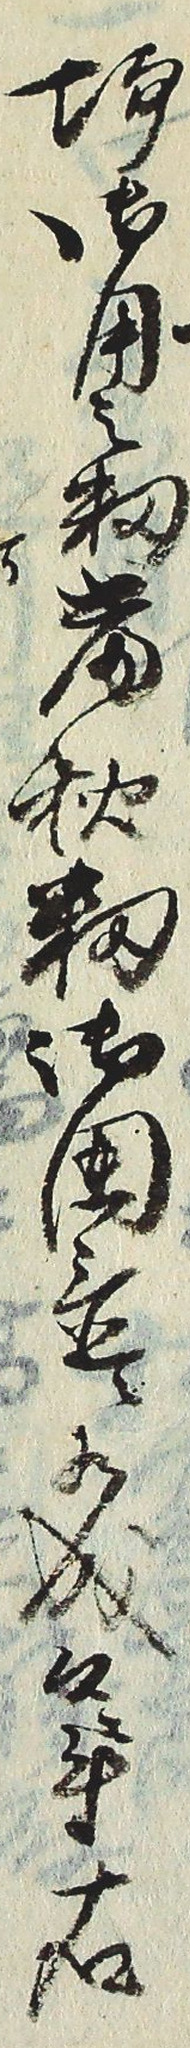場御用之籾当秋籾御囷置に相成候に付右
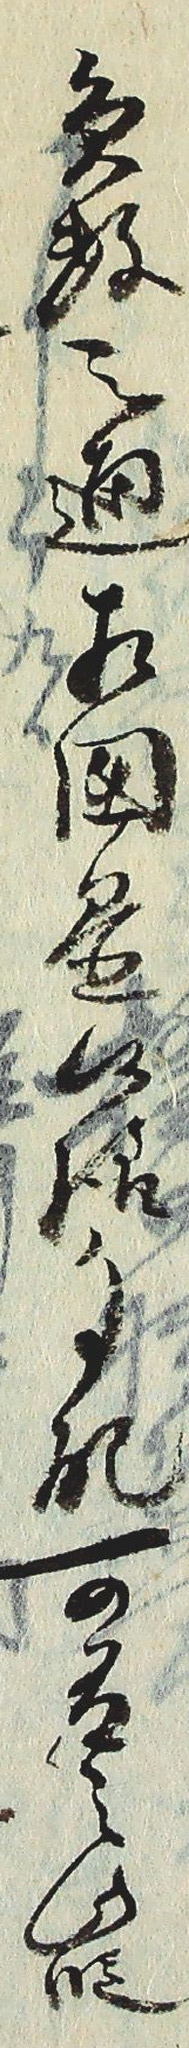員数之通り相囷置候様手配可有之此段
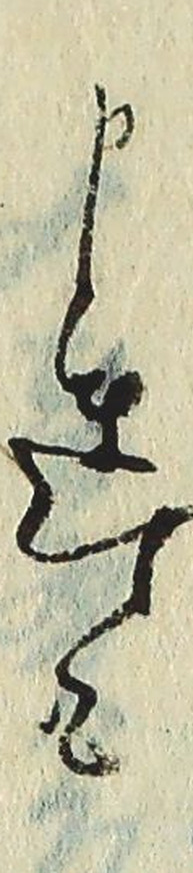申達候以上
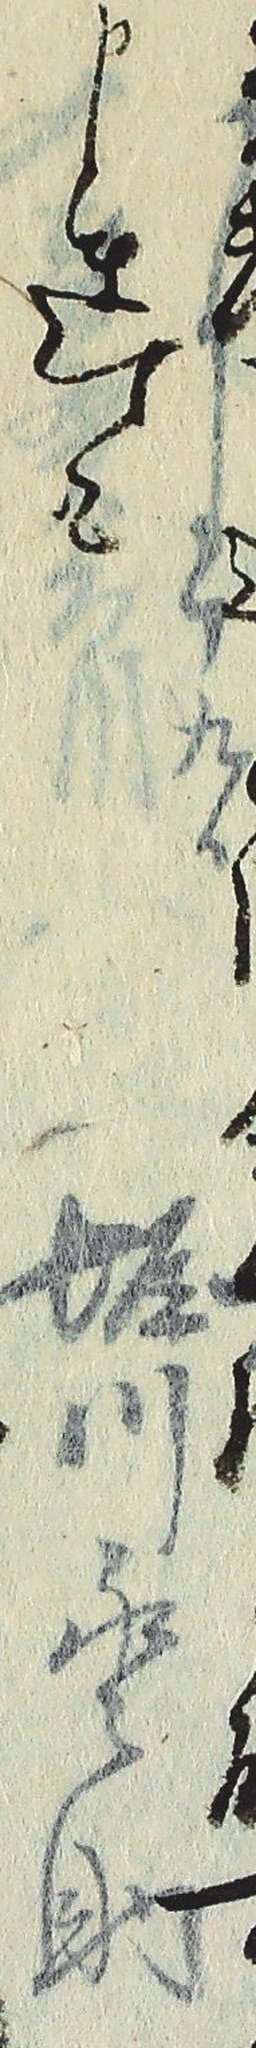申達候以上
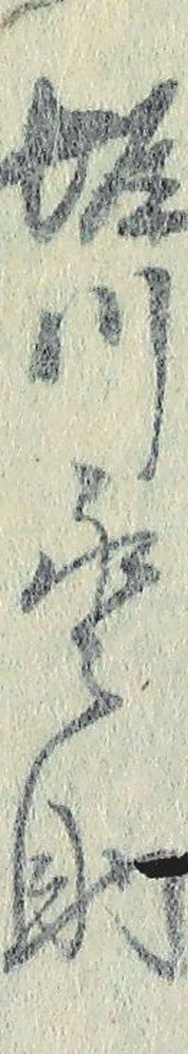堀川永之助
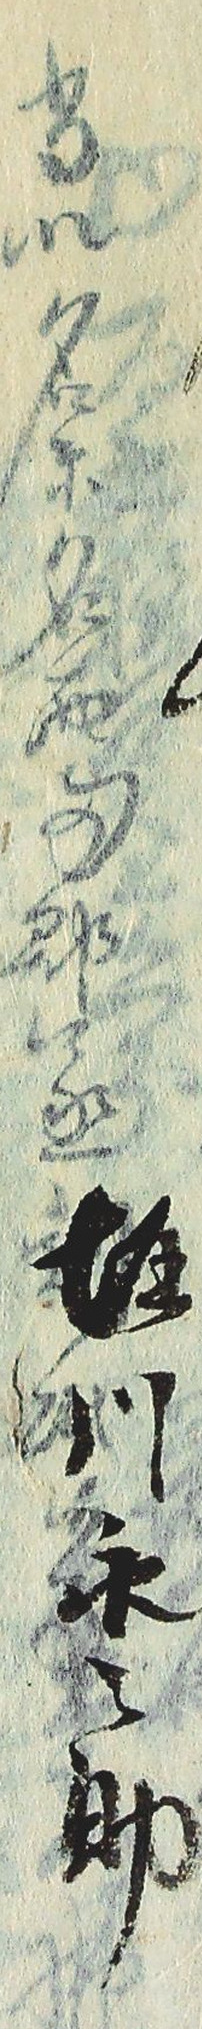堀川永之助
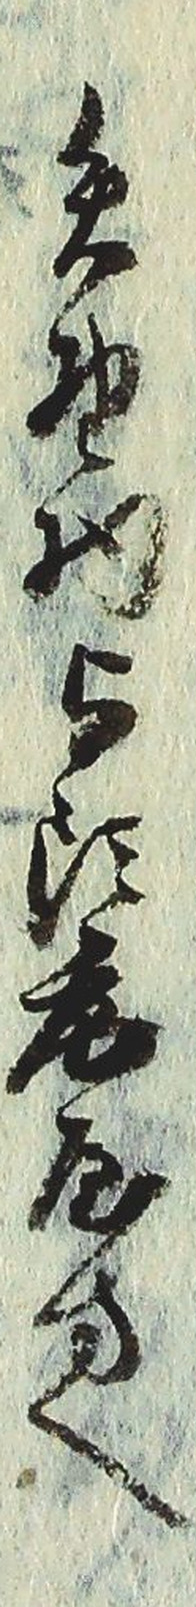矢野村与頭庄屋方へ
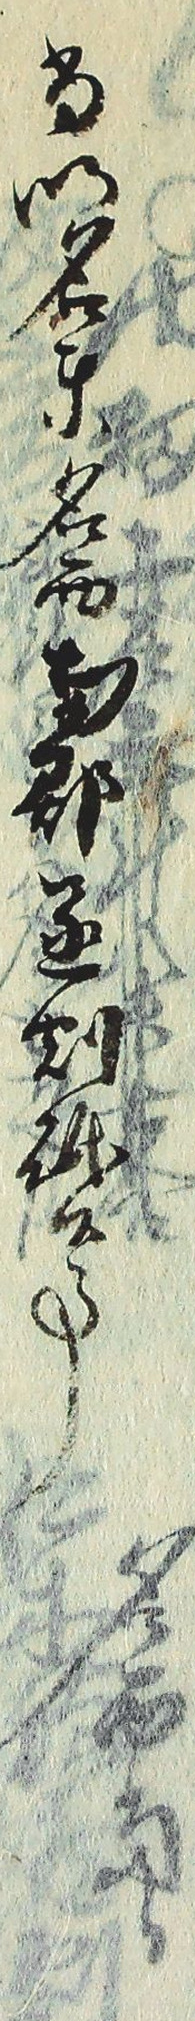尚以名東名西両郡遂割賦候事
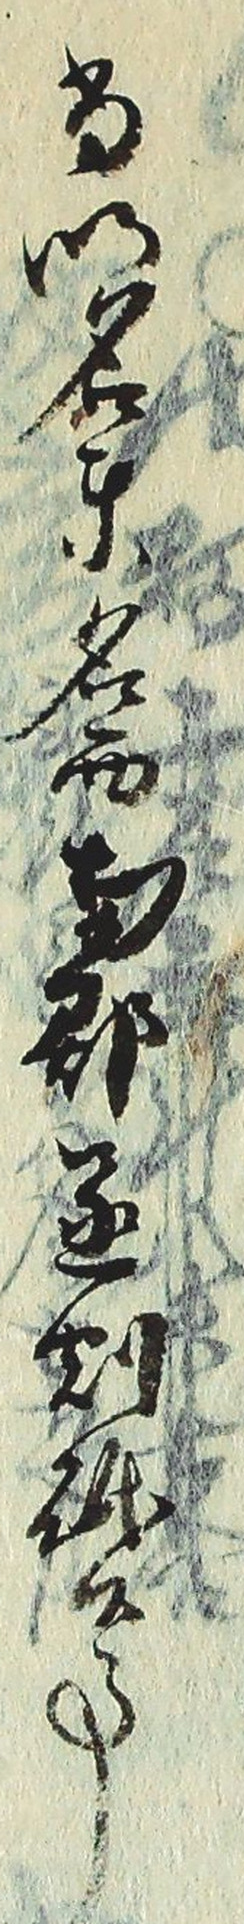尚以名東名西両郡遂割賦候事
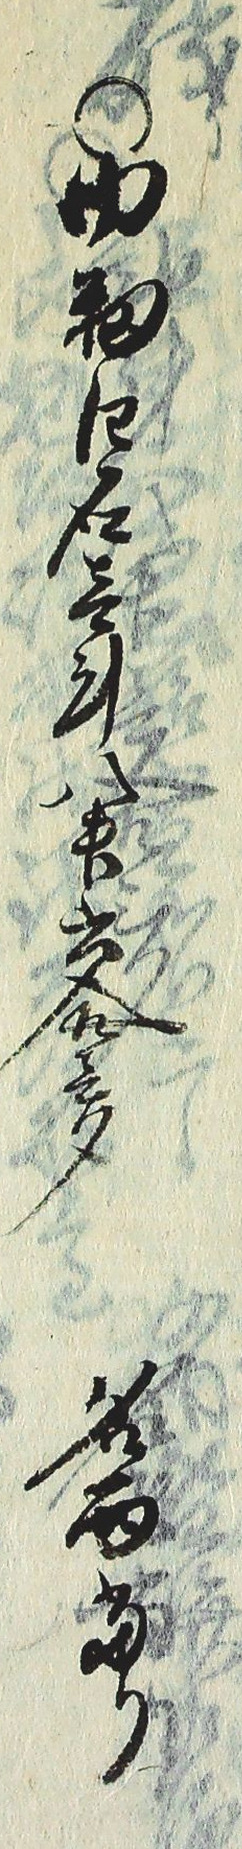内籾四石壱斗八升六合壱勺名西当り
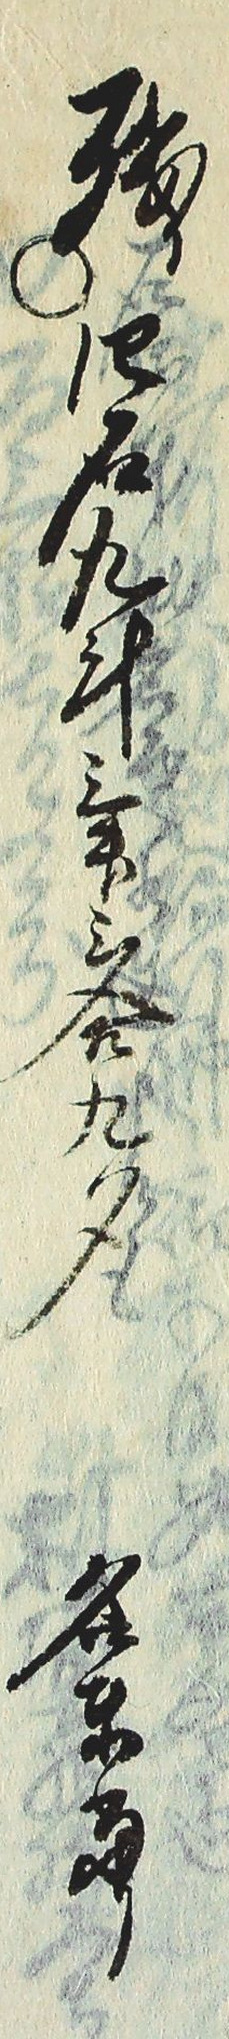残り四石九斗三升三合九勺名東当り
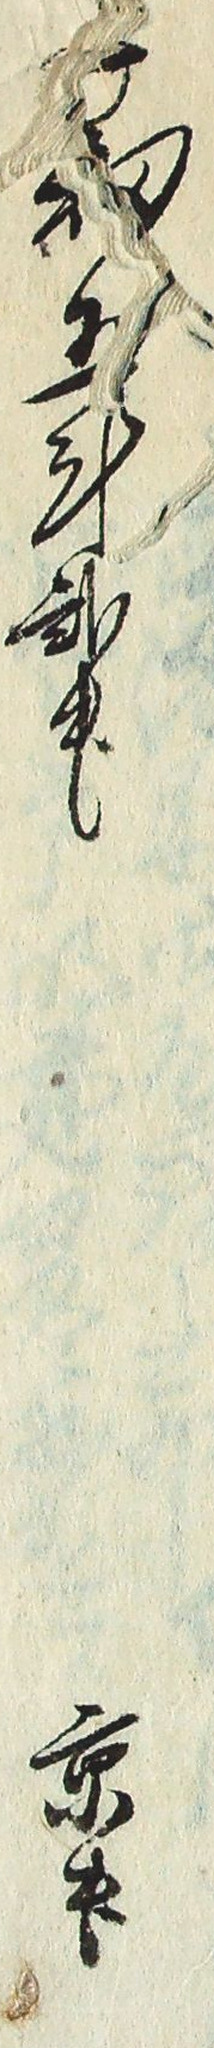一籾五斗弐升京舛

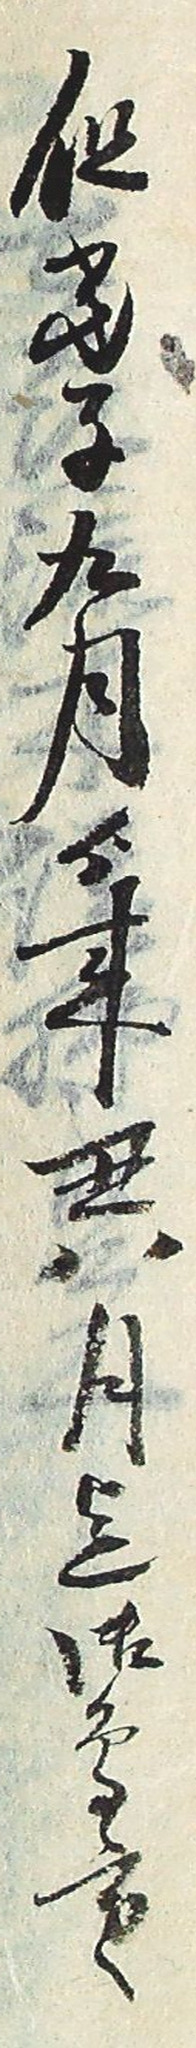但当子九月ゟ来丑八月迄御鳥方へ
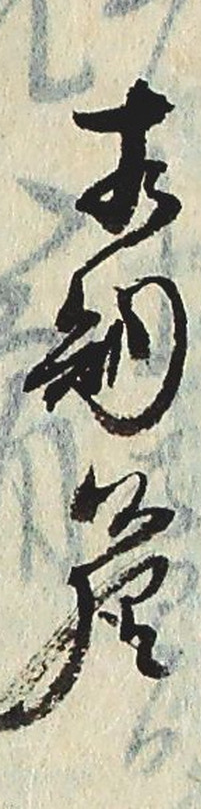相納候様
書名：名東郡中諸割賦元帳
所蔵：鳴門教育大学 Naruto University of Education
